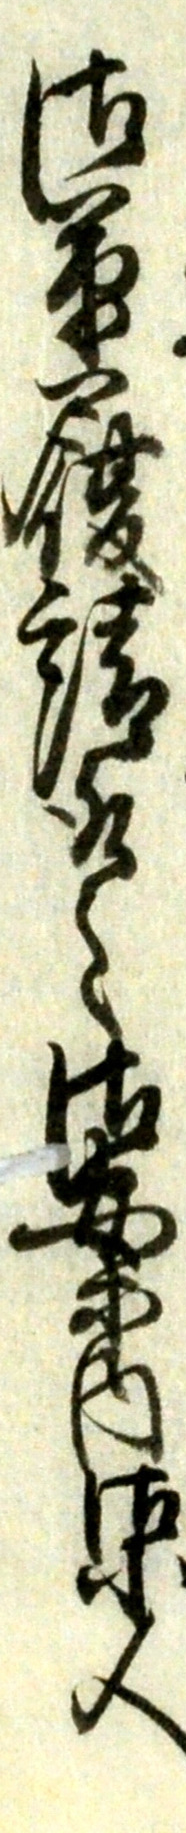御草履請取之御案内御小人
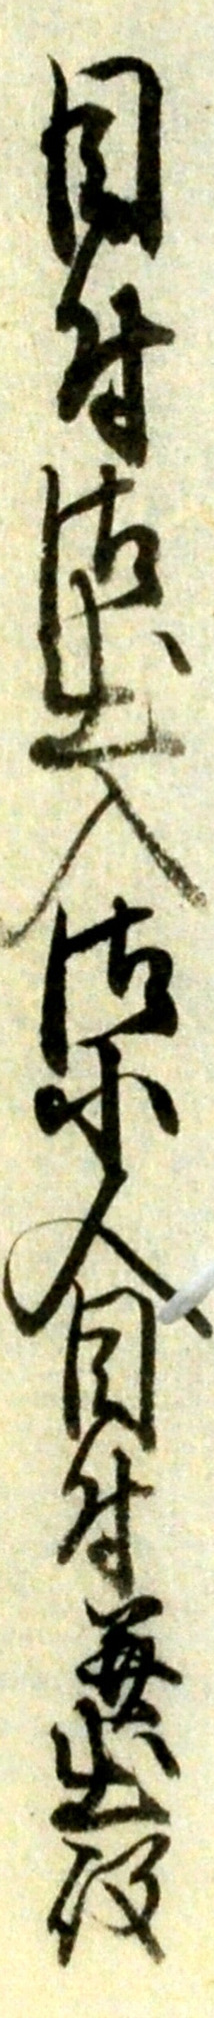目付御出入御小人目付并出役
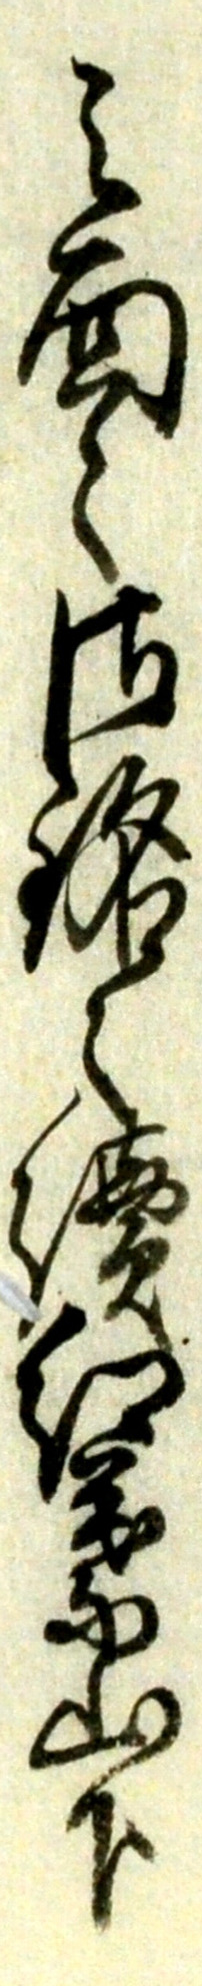之面々御銘々続紅葉山下
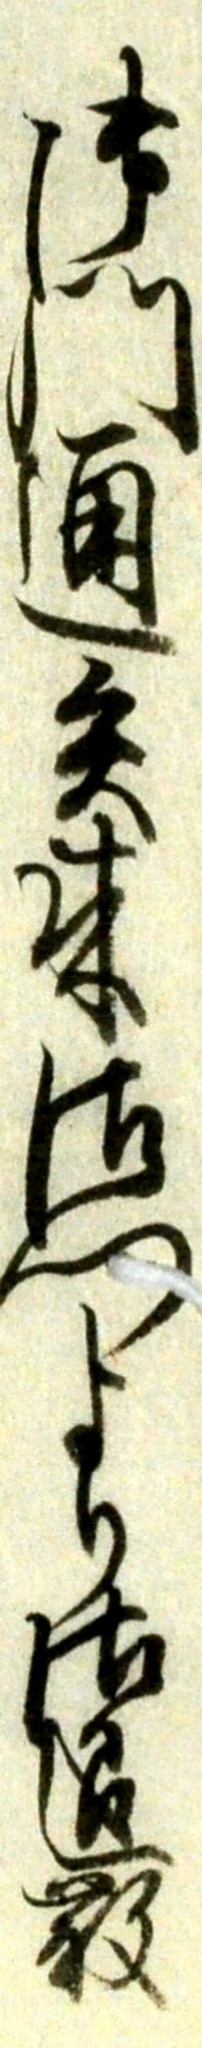御門通矢来御門より御退散
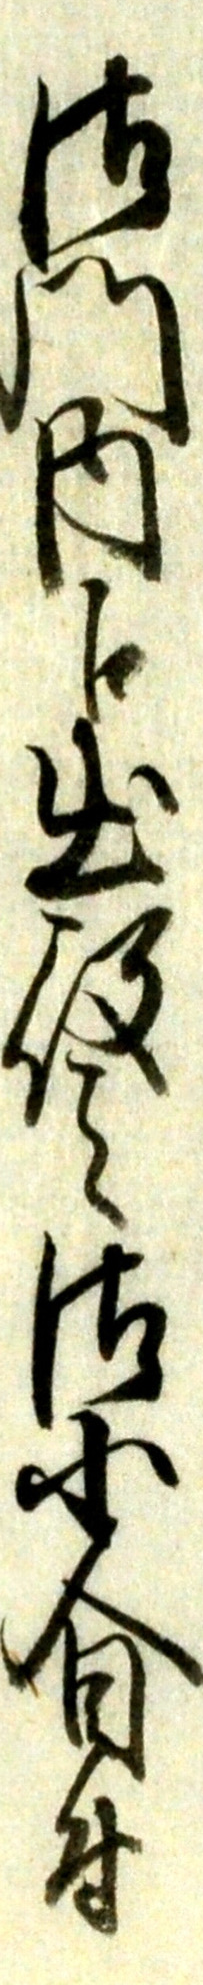御門内え出役之御小人目付
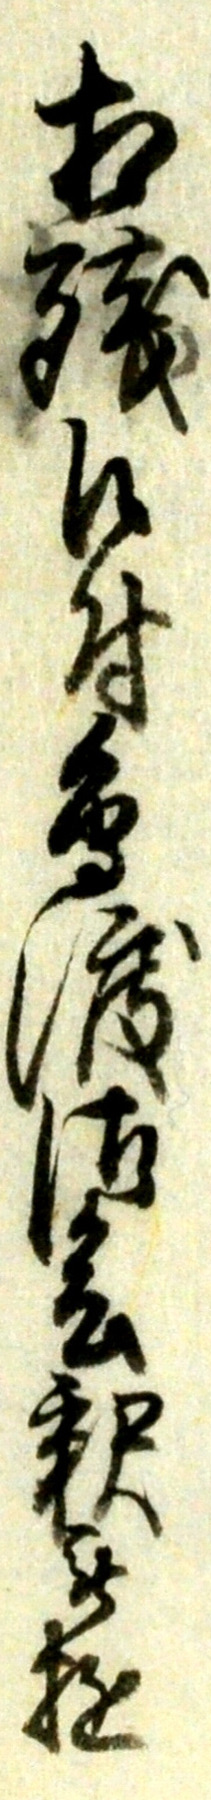相残候付鳥渡御会釈被遊
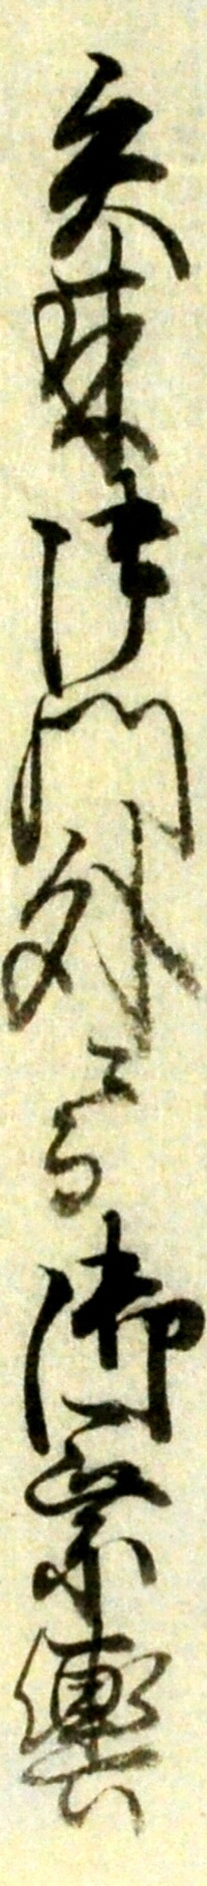矢来御門外ニ而御乗輿
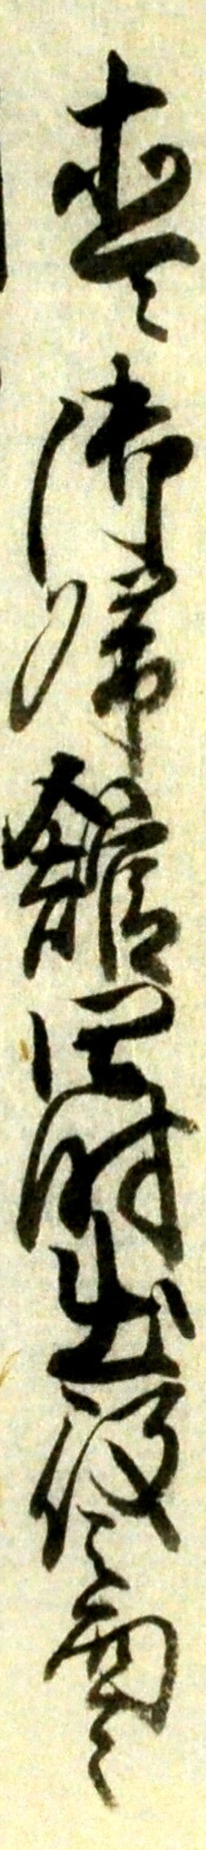直ニ御帰舘四時出役之面々
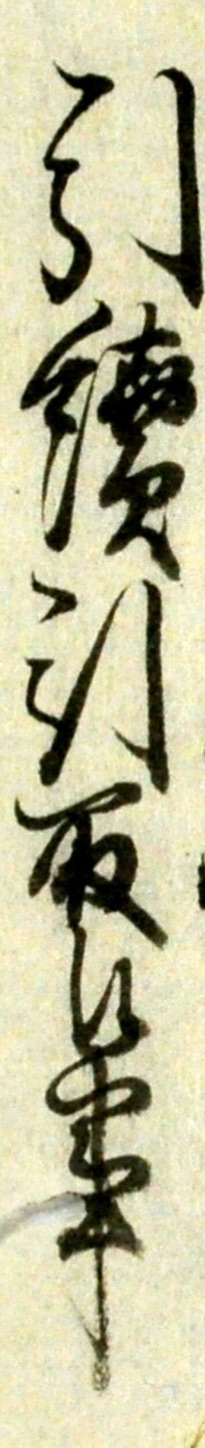引続引取候事

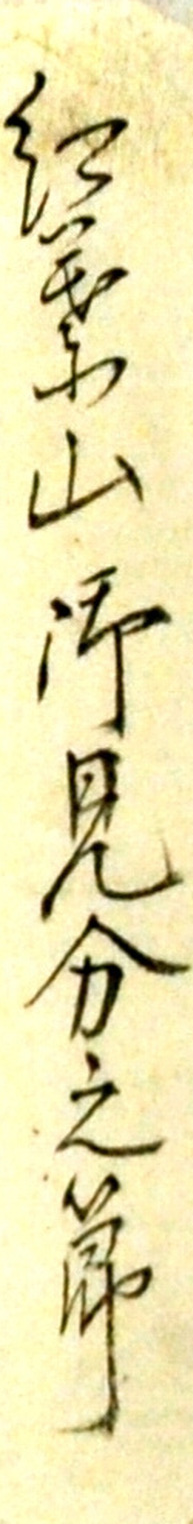紅葉山御見分之節
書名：紅葉山御見分ノ節ノ御書付
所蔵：伊那市立高遠町図書館・合同会社AMANE
